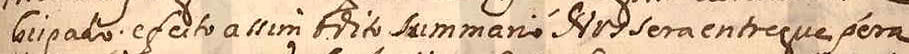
bispado; e feito assim o dito summario Nos sera entregue pera
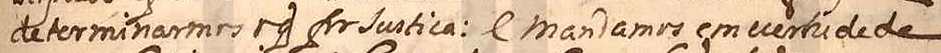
determinarmos o q̄ for Iustiça: e mandamos em uertude de
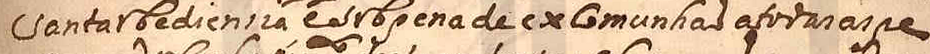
Santa obediensia, e sob pena de excomunhaõ a todas as pe
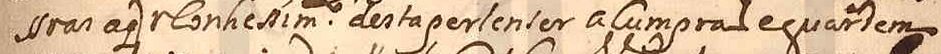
ssoas a q̄ o Conhessim.to desta pertenser a Cumpraõ e guardem
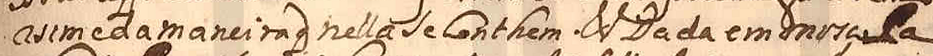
asim e da maneira q̄ nella se Conthem. & Dada em o nosso Pa
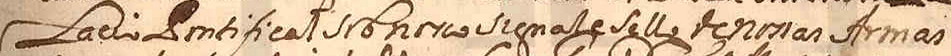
Lacio Pontifical sob nosso signal e sello de nossas Armas
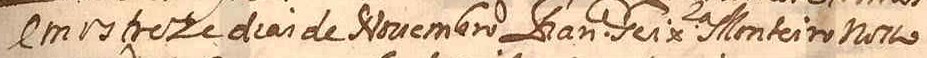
em os treze dias de Nouembro Fran.co Teix.ra Monteiro nosso
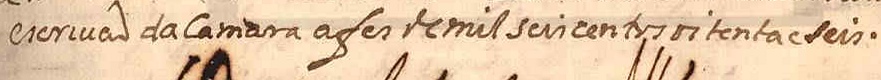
escriuaõ da Camara a fes de mil seiscentos oitenta e seis.
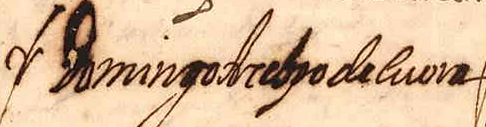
fr Domingo Arcebpo de Euora
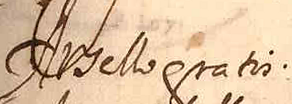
Ao sello gratis.
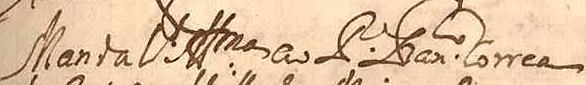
Manda V. Ill.ma ao P.e Fran.co Correa
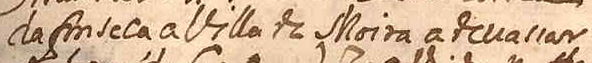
da fonseca a Villa de Moira a deuassar
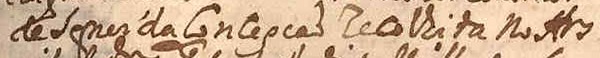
de Ignes da Concepçaõ Recolhida no Hos
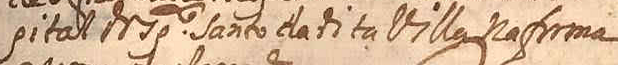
pital do sp.to Santo da dita Villa na forma
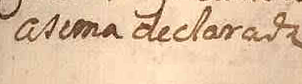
asima declarada
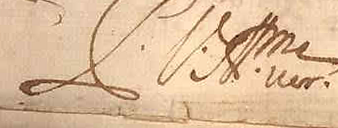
P. V. Ill.ma uer.
